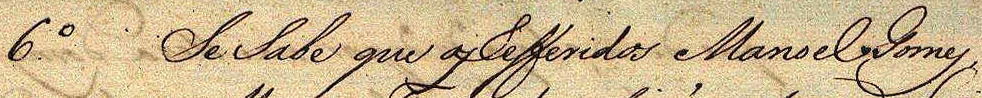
6.o Se Sabe que os Refferidos Manoel Gomes
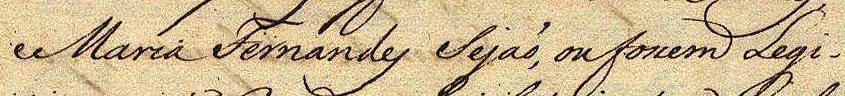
e Maria Fernandes sejaõ, ou fossem Legi
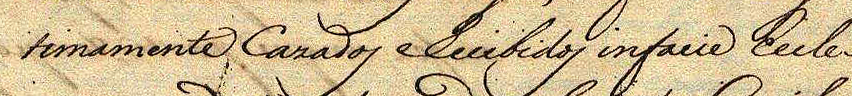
timamente cazados e Recebidos in facie eccle
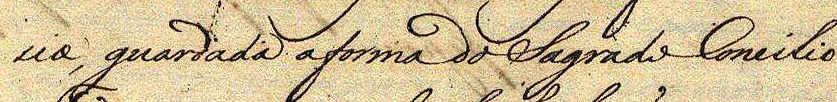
ziæ, guardada a forma do Sagrado Concilio
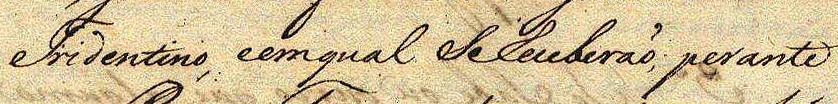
Tridentino, e em qual Se Receberaõ, perante
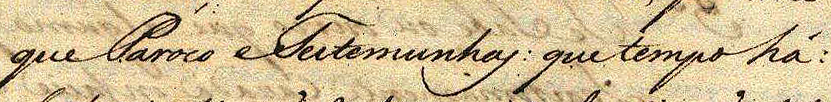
que Paroco, e Testemunhas: que tempo há:
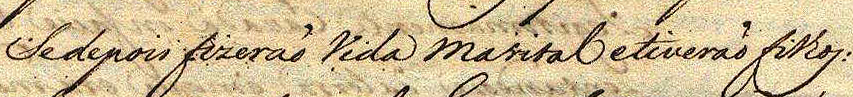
Se depois fizeraõ Vida marital e tiveraõ filhos:
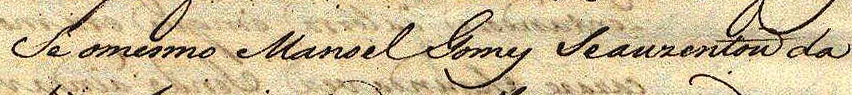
Se o mesmo Manoel Gomes se auzentou da
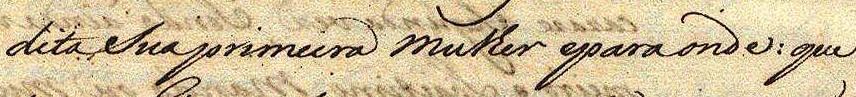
dita sua primeira mulher e para onde: que
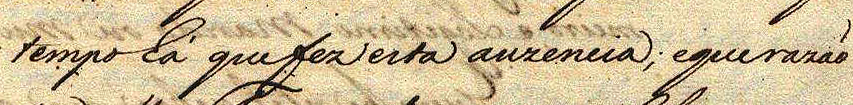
tempo há que fez esta auzencia; e que razaõ
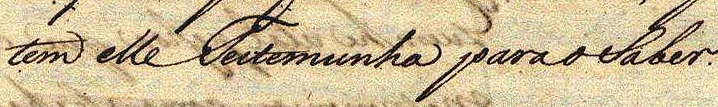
tem elle Testemunha para o Saber.
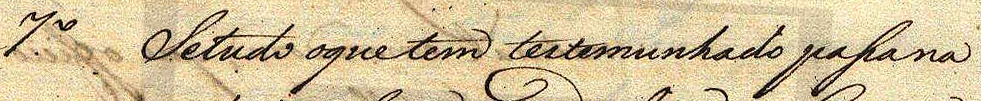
7.o Se tudo o que tem testemunhado passa na
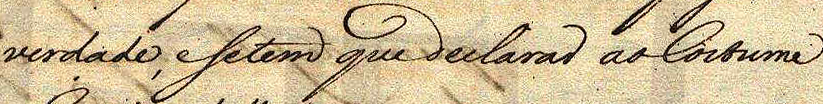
verdade, e se tem que declarar ao Costume
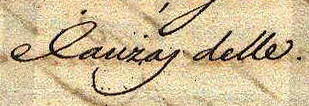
e Cauzas delle.
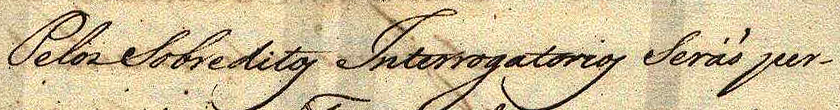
Peloz Sobreditos Interrogatorios Seraõ per
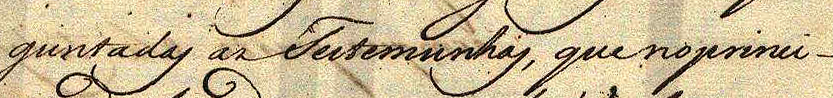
guntadas as Testemunhas, que no princi
